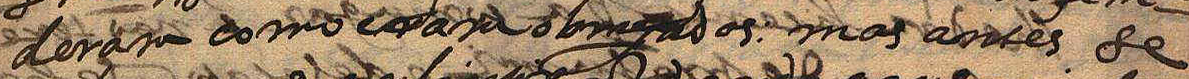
deram como eram obrigados: mas antes se
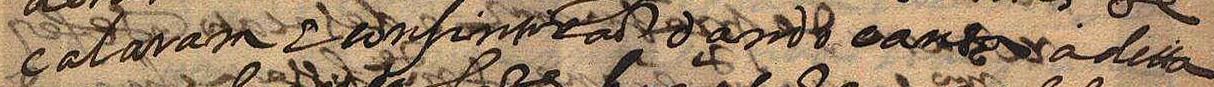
calaram E consintiraõ dando causa a ditta
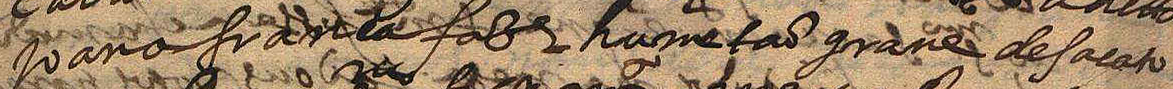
Joana franca fazer hum taõ graue desacato
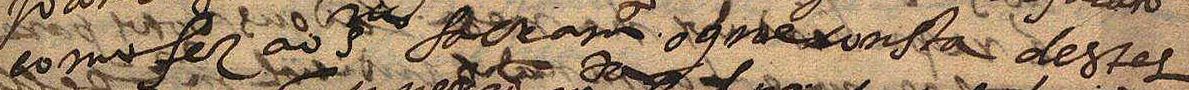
como fez ao smo sacramto. o que consta destes
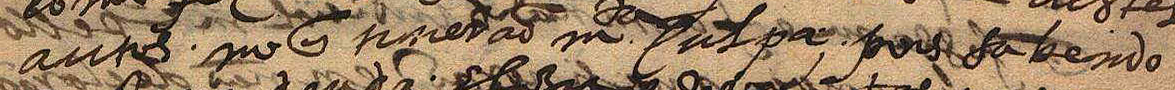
autos. no que tiueraõ mta Culpa pois sabendo
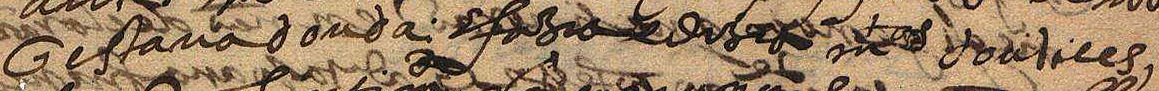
q̄ estaua douda E fazia e dizia mtas doudices,
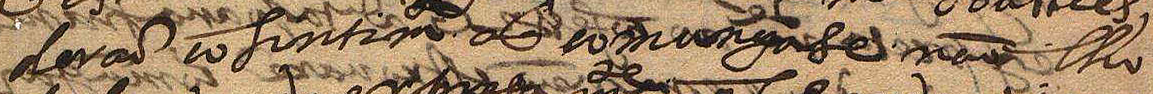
deraõ cōsintimto a q̄ comungase não lho
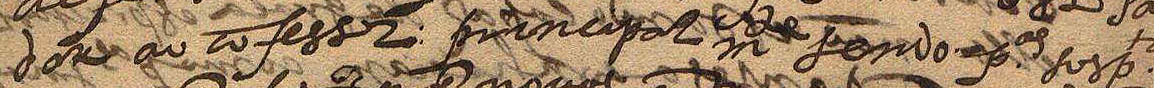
dor ao cōfessor principalmte sendo pas sosptas
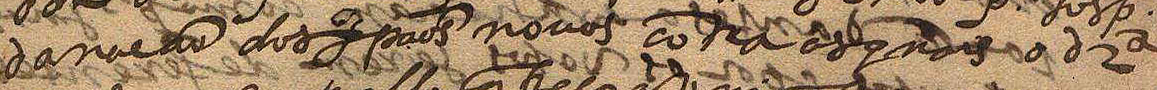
da naçaõ dos xpaõs nouos c̄otra as quais o drto
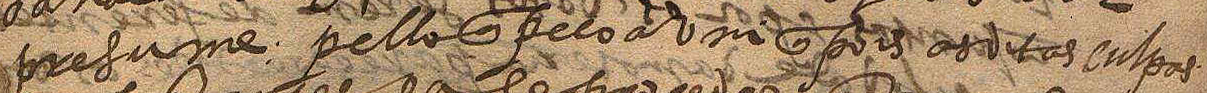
presume: pello q̄ peço a v m q̄ pois as ditas culpas
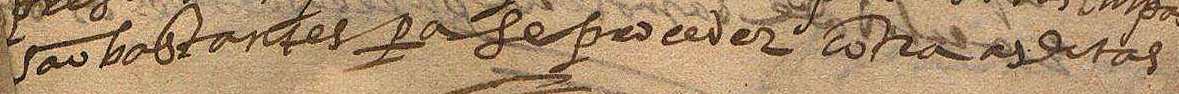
são bastantes ꝑa se proceder c̄otra as ditas
